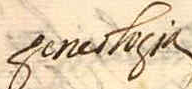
geneologia
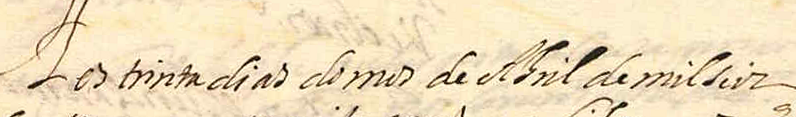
Aos trinta dias do mes de Abril de mil seis
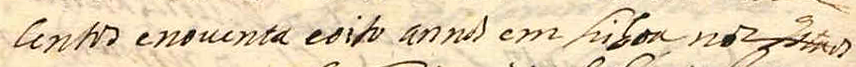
centos e nouenta e oito annos em Lisboa nos Estaos
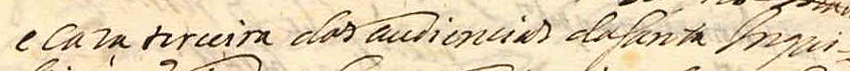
e caza terceira das audiencias da santa Inqui
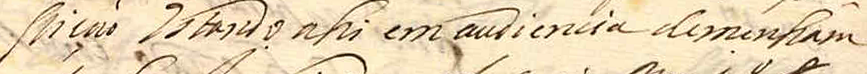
ssição Estando ahi em audiencia de menham
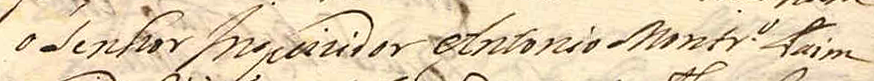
o Senhor Jnquizidor Antonio Montr.o Paim
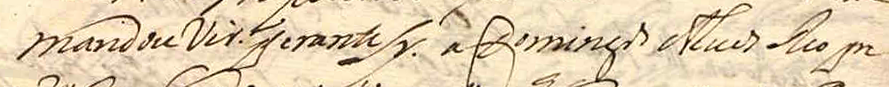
mandou vir. perante sy. a Domingos Alues Reo pre
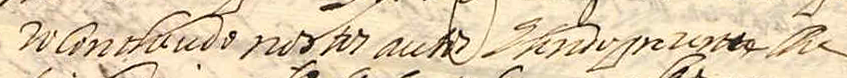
zo contheudo nestes autos E sendo prezente lhe
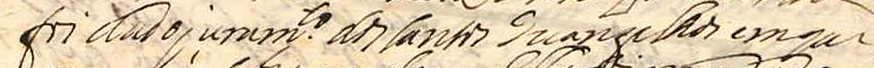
foi dado juram.to dos santos euangelhos em que
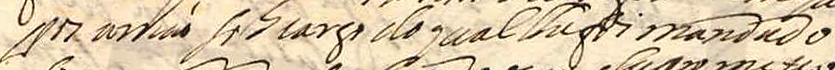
pos a maõ sob cargo do qual he foi mandado
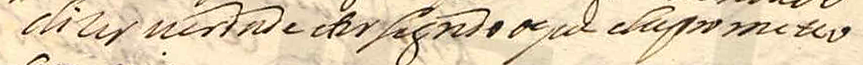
dizer uerdade e ter segredo o que elle prometeo
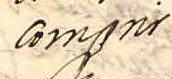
comprir
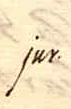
jur.
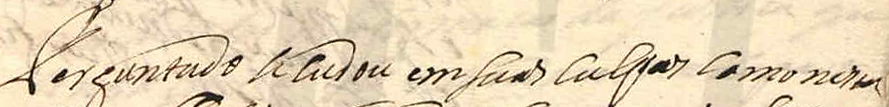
Perguntado se cudou em suas culpas como nesta
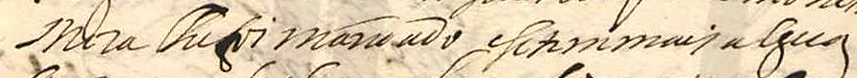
Meza lhe foi mandado e se tem mais algua
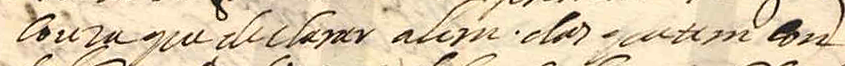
couza que declarar além das que tem con
